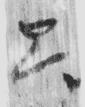巳
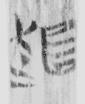𧻚
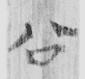公
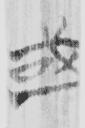或
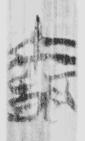{尒䎽}
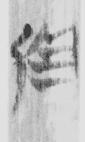於
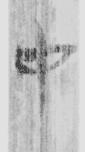中
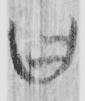曰
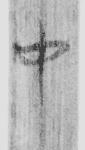中
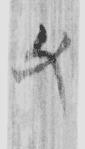父
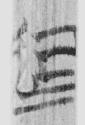起
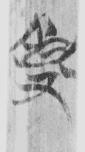事
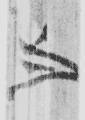之
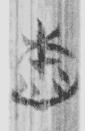本B（本）
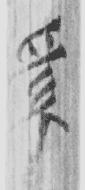奚
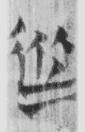從
